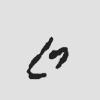㠯（以）
